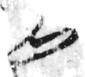㠯
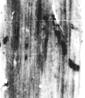北
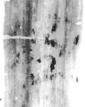兇（凶）
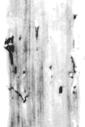啟
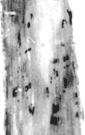閟（閉）
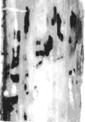朝
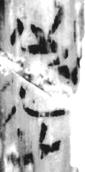逃（盜）
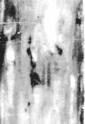不
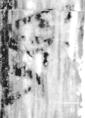○（得）
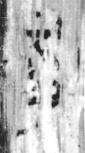晝
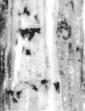○（得）
